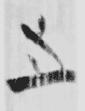之
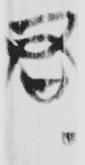君
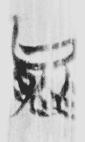能
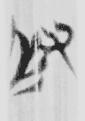攸
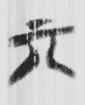亓
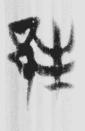邦
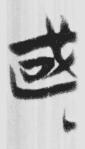或
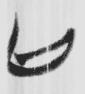㠯（以）
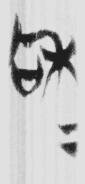和=
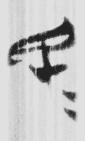民=
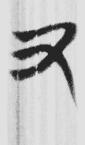又
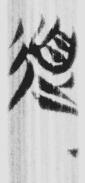道
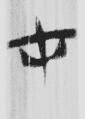才
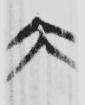大
